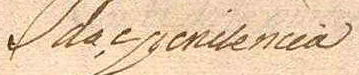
Ida, e penitencia
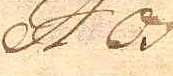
Aos
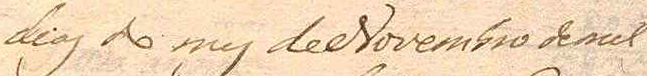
dias do mes de Novembro de mil
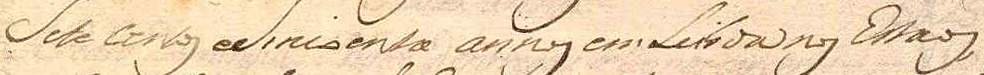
Setecentos e Sincoenta annos em Lisboa nos Estaos,
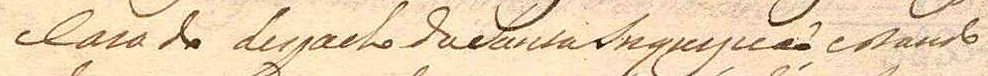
e Caza do despacho da Santa Inquisicaõ, estando
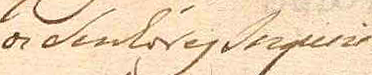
os Senhores Inquizi
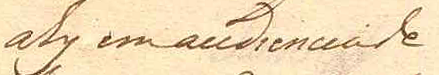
ahy em audiencia de
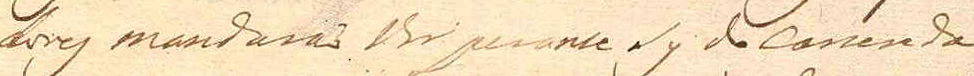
dores mandaraõ Vir perante sy do camera[?] da
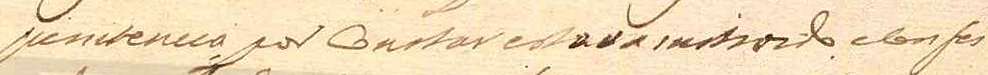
penitencia, por Constar estava instroido e confes
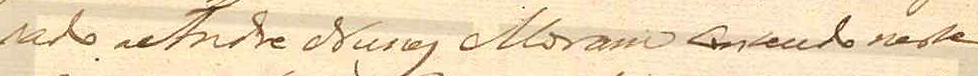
sado a Andre Nunes Moram conteudo neste
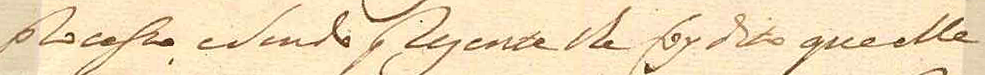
processo, e Sendo presente lhe foy dito que elle
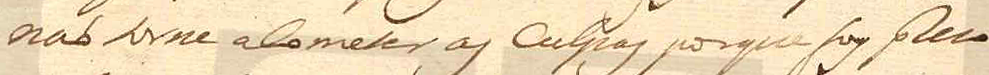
naõ torne a Cometer as Culpas porque foy prezo
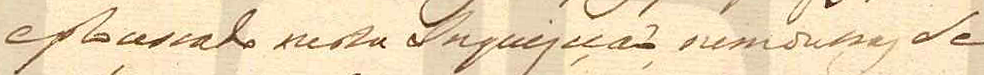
e processado nesta Inquisiçaõ, nem outras se
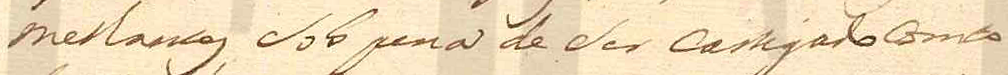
melhantes, sob pena de ser castigado Com to
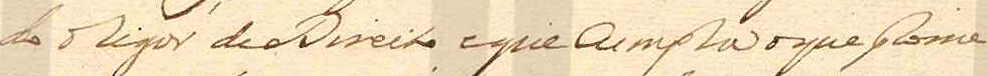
do o Rigor de Direito, e que Cumpra o que prome
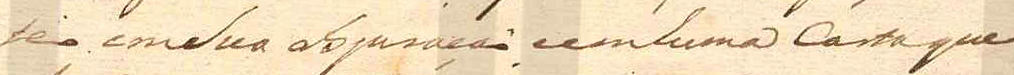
teo em Sua abjuraçaõ, e em huma Carta que
